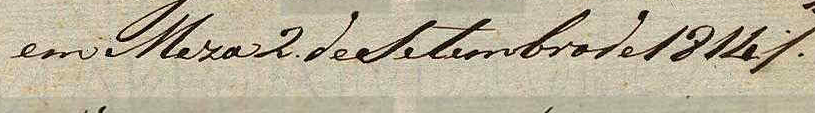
em Meza 2. de Setembro de 1814
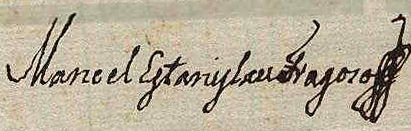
Manoel Estanislau Fragoso
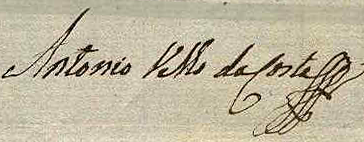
Antonio Velho da Costa
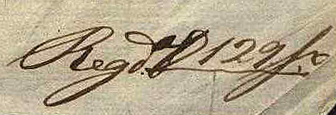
Regd.a f 129 f.r
